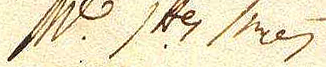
Mto. Ill.es Snres̄
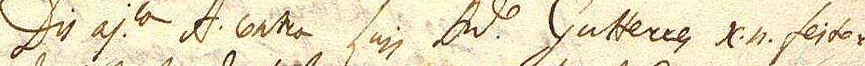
Dis a j.ca A. contra Luis An.to Gutterres x. n. feitor
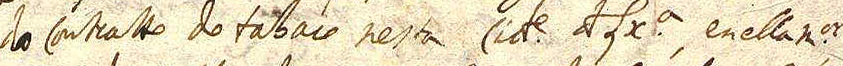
do Contratto do tabaco nesta Cid̄e. d̄ Lx.a, e nella m.or,
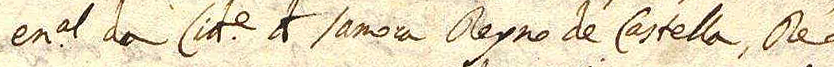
e n.al da Cid̄.e d̄ Samora Reyno de Castella, Reo
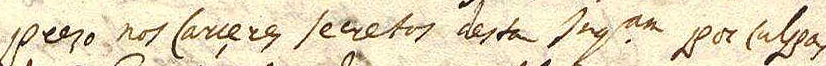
prezo nos Carçeres secretos desta Jnq.am por Culpas
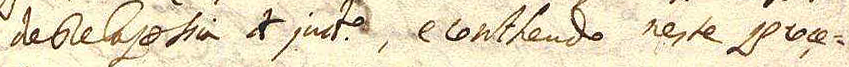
de Relapsia d̄ jud̄.o, e contheudo neste proçe
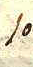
so.
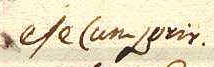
e se Cumprir.
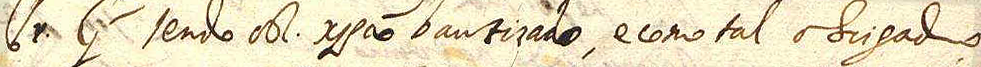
Pr. Q sendo o R. xpaõ bautizado, e como tal obrigado
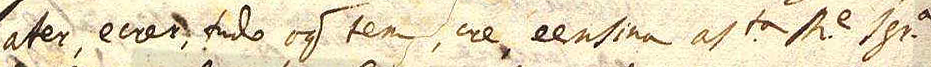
a ter, e crer, tudo o q̄ tem, cre, e ensina a sta. M.e Igr.a
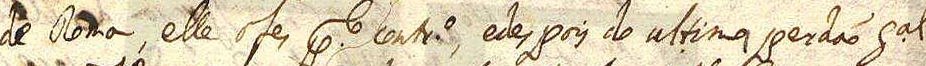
de Roma, elle o fes p.lo contr.o, e despois do ultimo perdaõ g.al
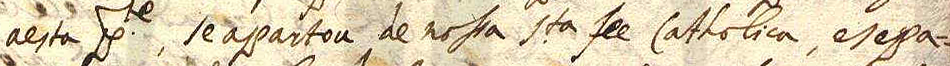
a esta p.te, se apartou de nossa s.ta fee Catholica, e sepa
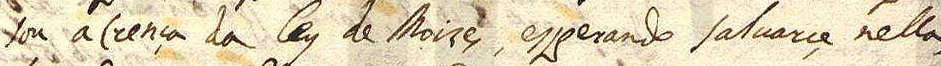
sou a Crença da ley de Moizes, esperando saluarçe nella,
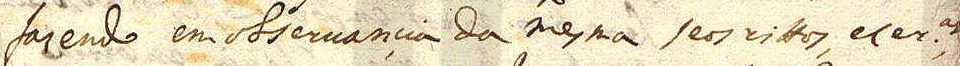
fazendo em oberuançia da mesma seos rittos, e cer.as,
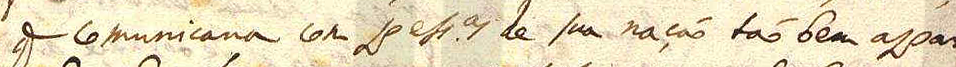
q̄ comunicaua com pess.as de sua naçaõ taõ bem apar
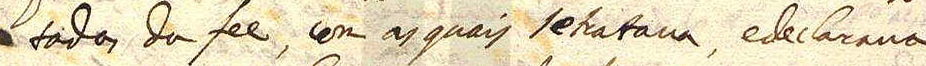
tadas da fee, com as quais se trataua, e declaraua
